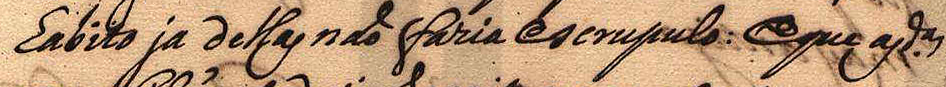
habito ja dellas naõ fazia escrupulo: E que as d.as
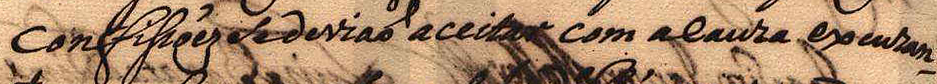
confissoẽz se deviaõ aceitar com a cauza excuzan
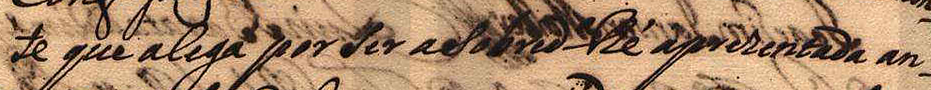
te que alega por ser a sobreda Ré aprezentada an
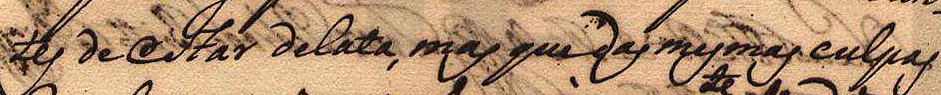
tes de estar delata, mas que das mesmas culpas
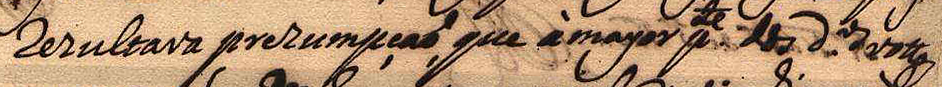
Rezultava prezumpçaõ, que à mayor p.te dos d.os vottos
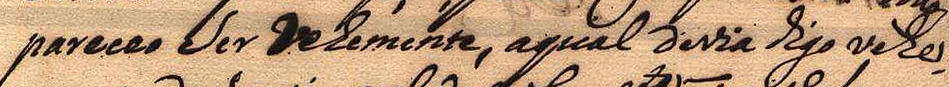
pareceo Ser vehemente, a qual devia digo vehe
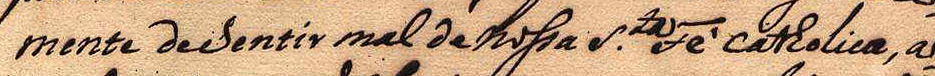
mente de Sentir mal de nossa s.ta Fé catholica, a
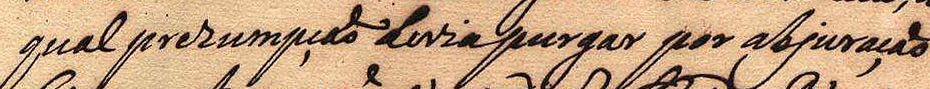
qual prezumpção devia purgar por abjuraçaõ
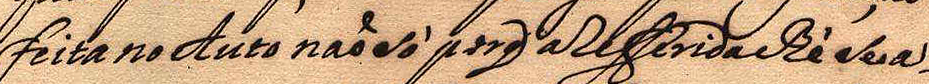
feita no Auto naõ só porq̄ a Refferida Ré se a
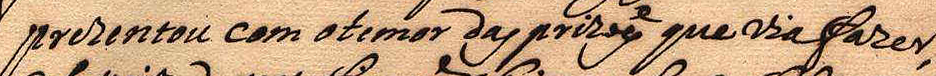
prezentou com o temor das prizoẽs que via fazer,
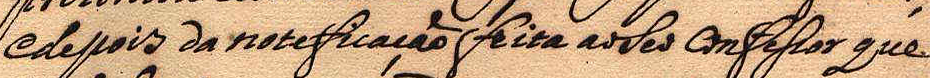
e depois da notificaçaõ feita ao Seo confessor que
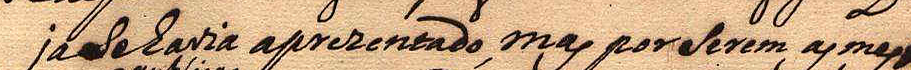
ja Se havia aprezentado, mas por serem as mes
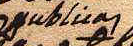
publicas
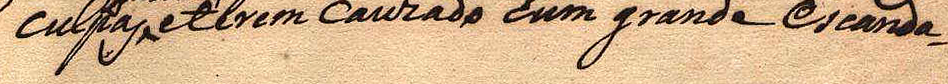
culpas, e terem cauzado hum grande escanda
